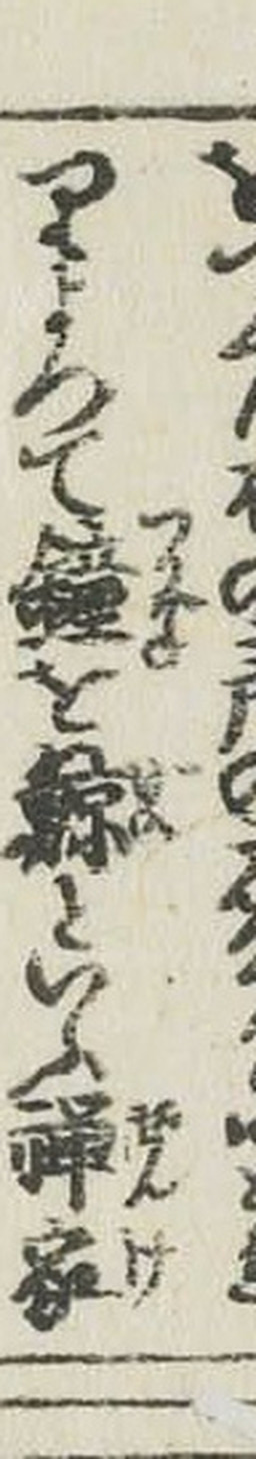りよつて鐘を鯨といふ禅家
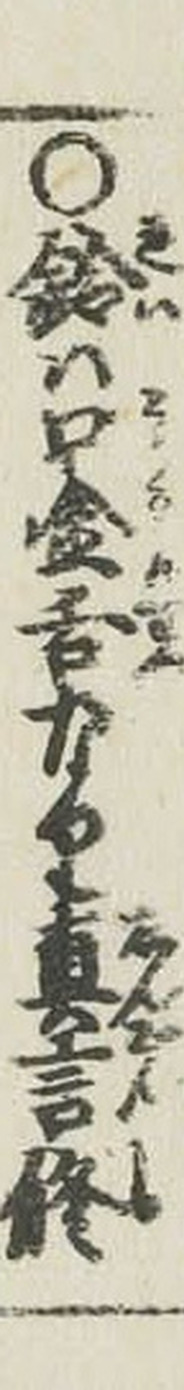○鈴は口金舌なり真言修
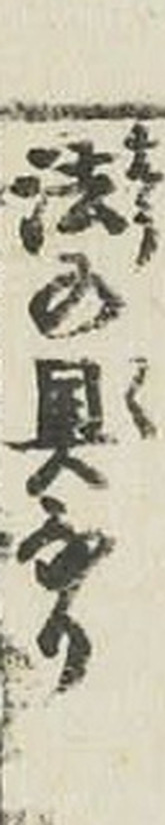法の具なり
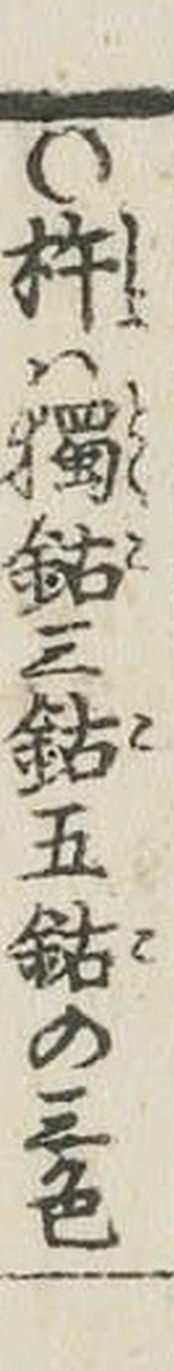○杵は独鈷三鈷五鈷の三色
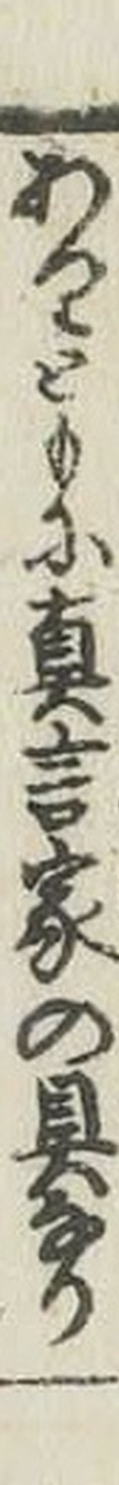ありともに真言家の具なり
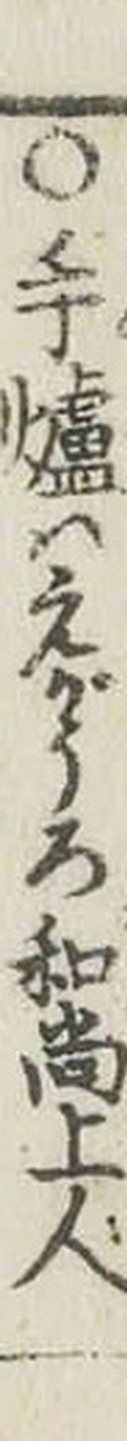○手炉はえがうろ和尚上人
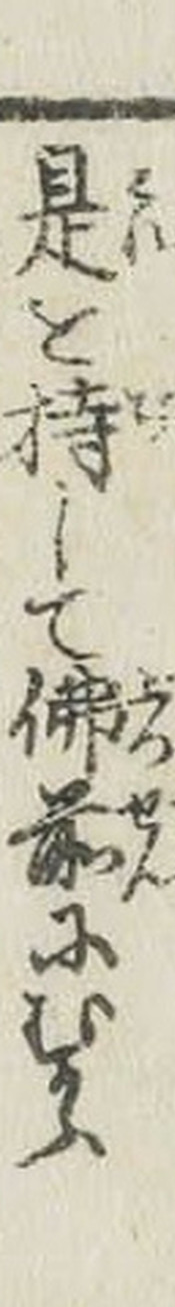是を持して仏前にむかふ
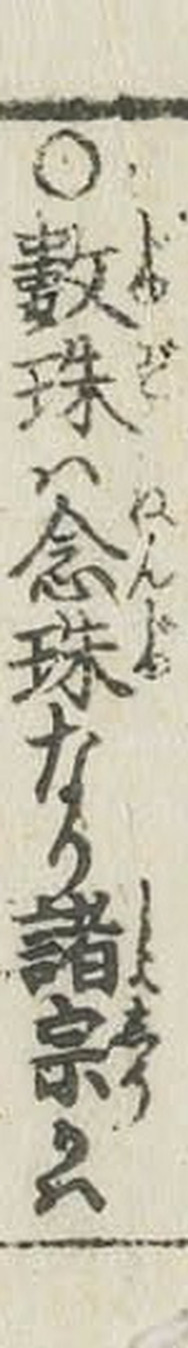○数珠は念珠なり諸宗かは
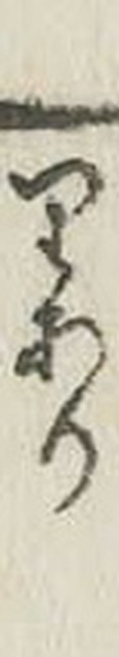りあり
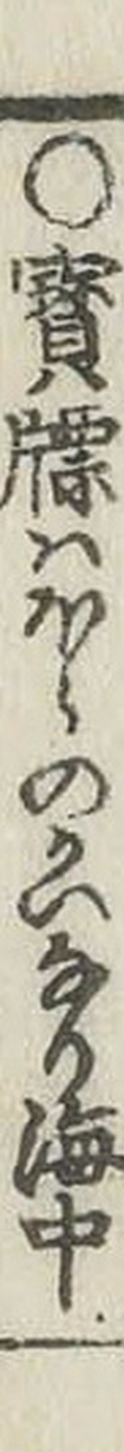○宝▢はほらのかいなり海中
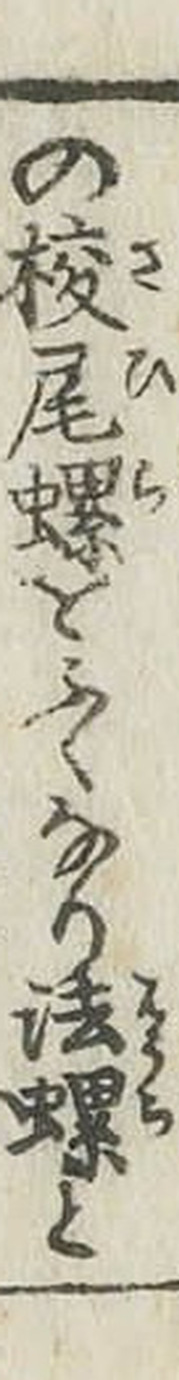の梭尾螺をふくなり法螺と
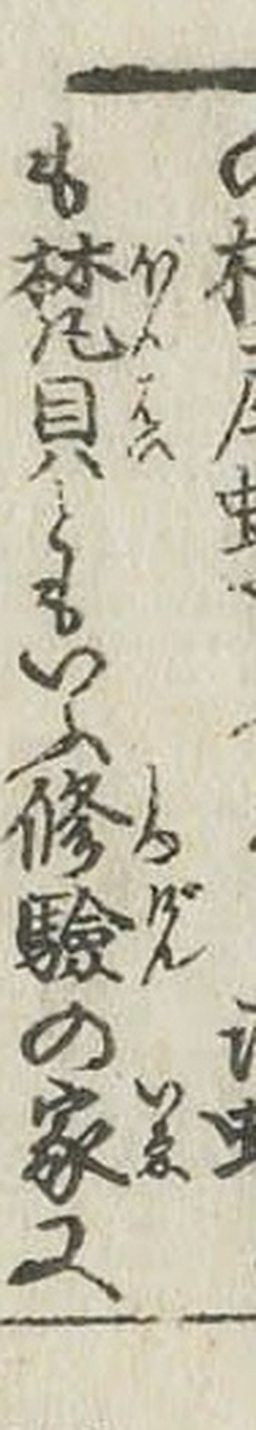も梵貝ともいふ修験の家又
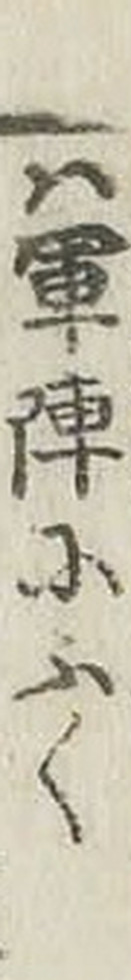は軍陣にふく
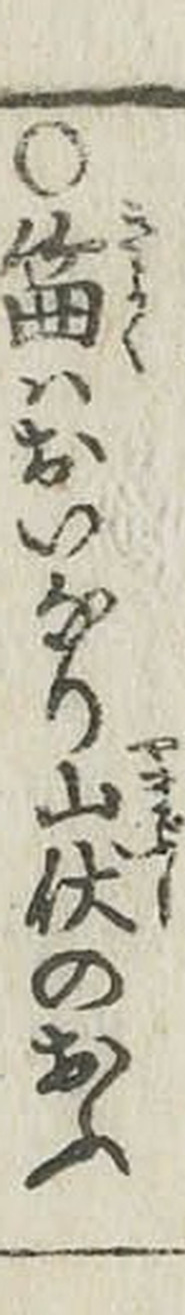○筁はおいなり山伏のおふ
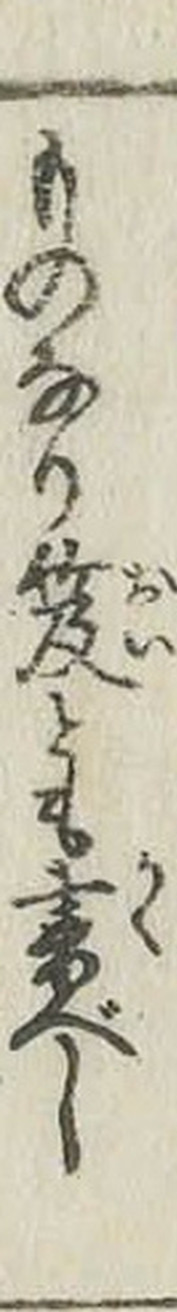ものなり笈とも書べし
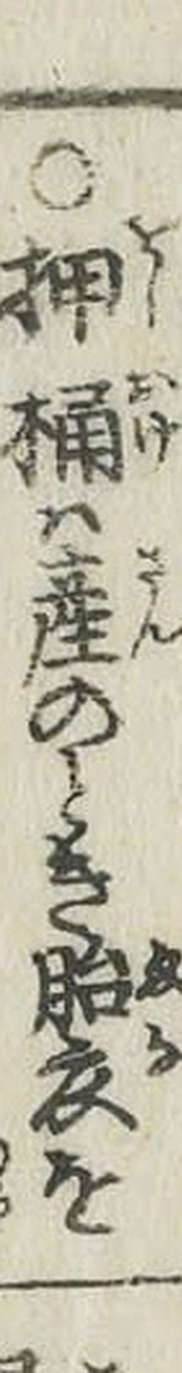○押桶は産のとき胎衣を
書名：増補頭書訓蒙図彙大成 10巻 5:巻之9-11
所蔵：東京学芸大学教育コンテンツアーカイブ
